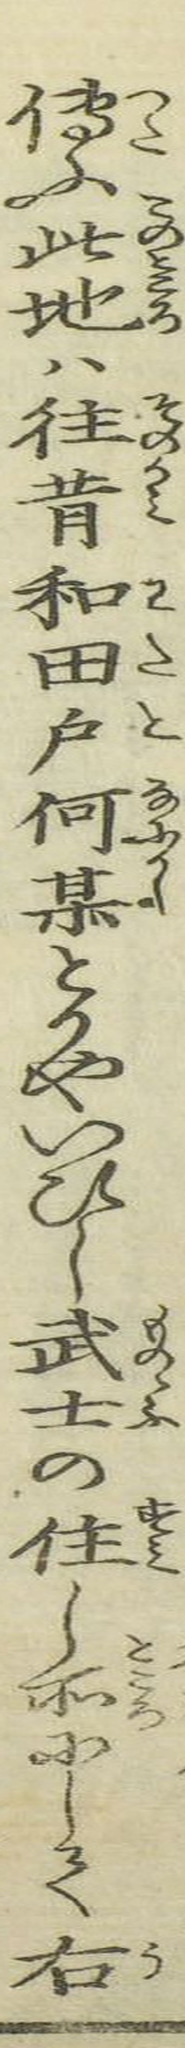傳ふ此地は往昔和田戸何某とかやいひし武士の住し所にして右
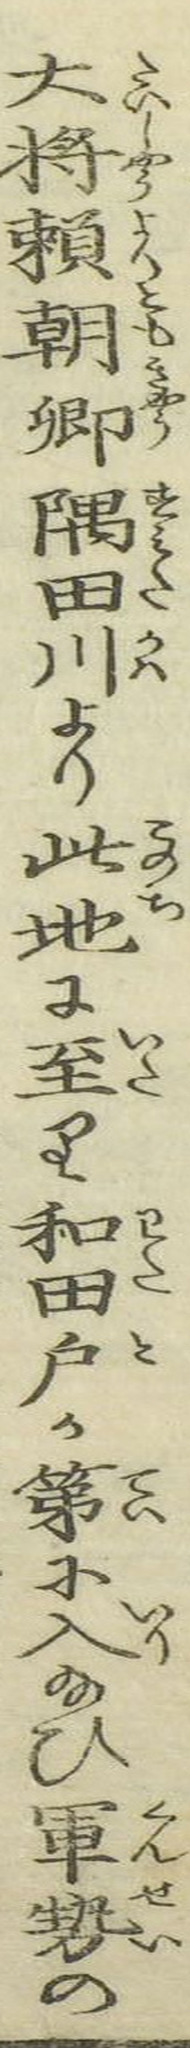大將頼朝卿隅田川より此地に至り和田戸か第に入給ひ軍㔟の
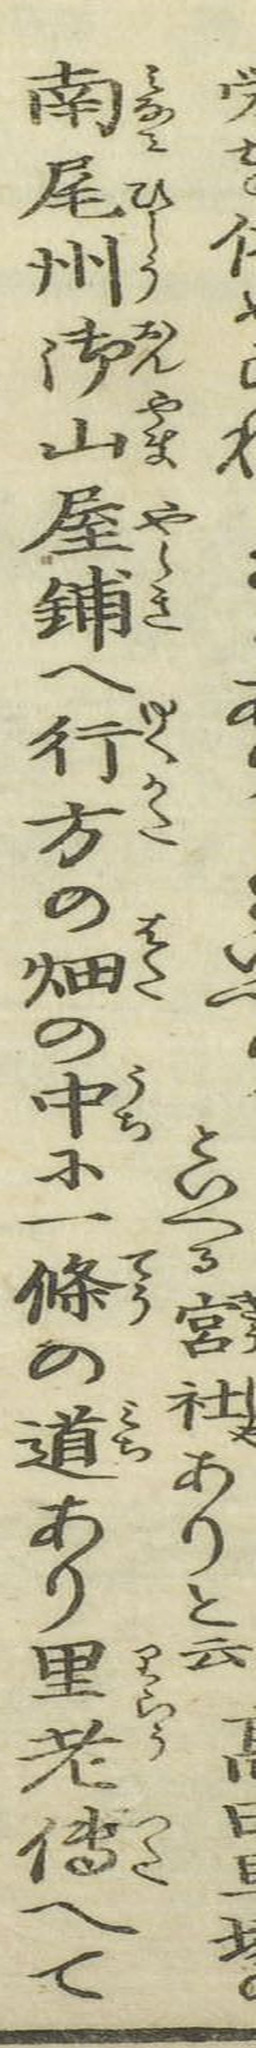南尾州御山屋鋪へ行方の畑の中に一條の道あり里老傳へて
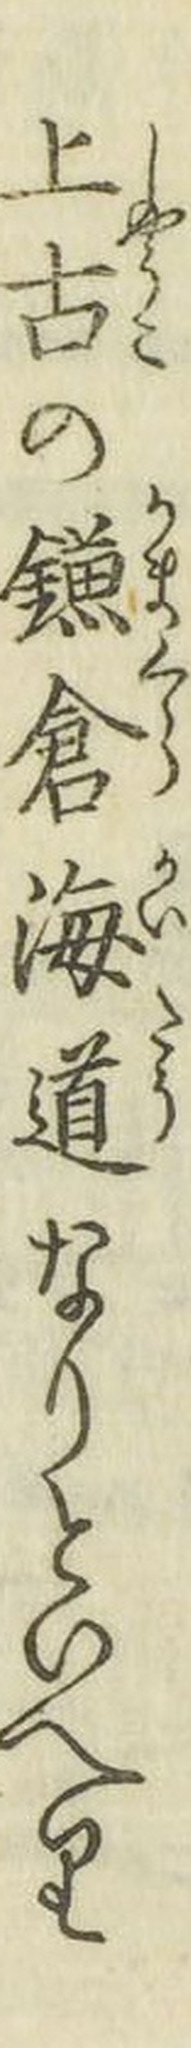上古の鎌倉海道なりといへり
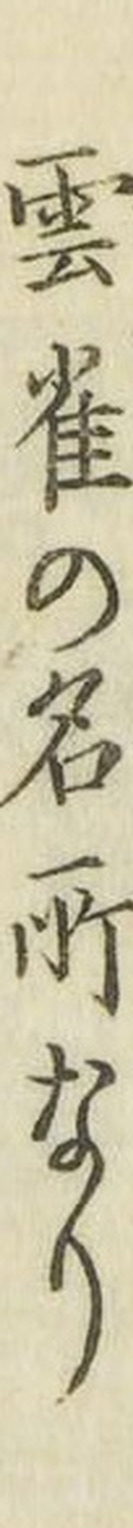雲雀の名所なり
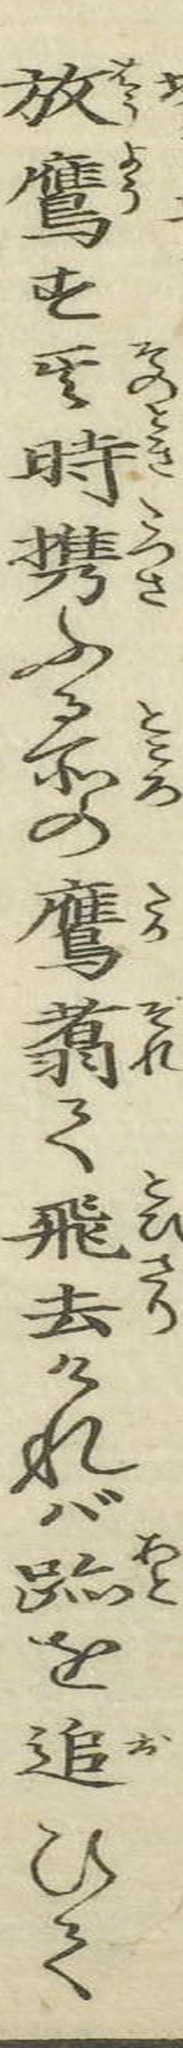放鷹す其時携ふる所の鷹翥て飛去ければ跡を追ひて
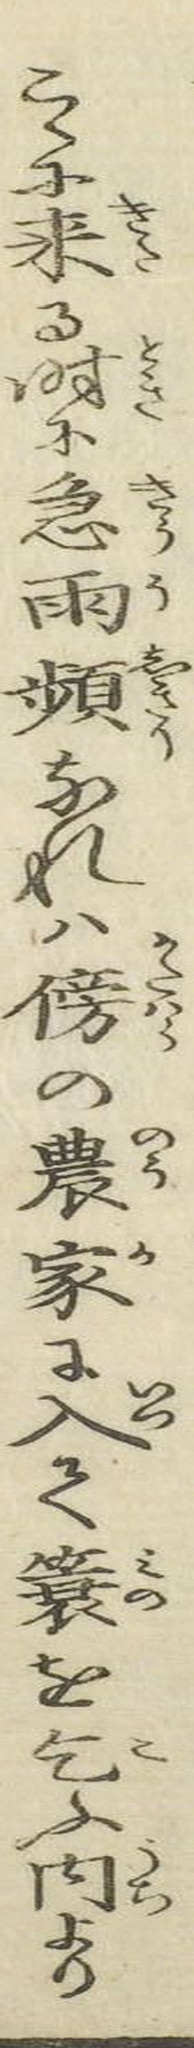こゝに来る时に急雨頻なれは傍の農家に入て簑を乞ふ内より
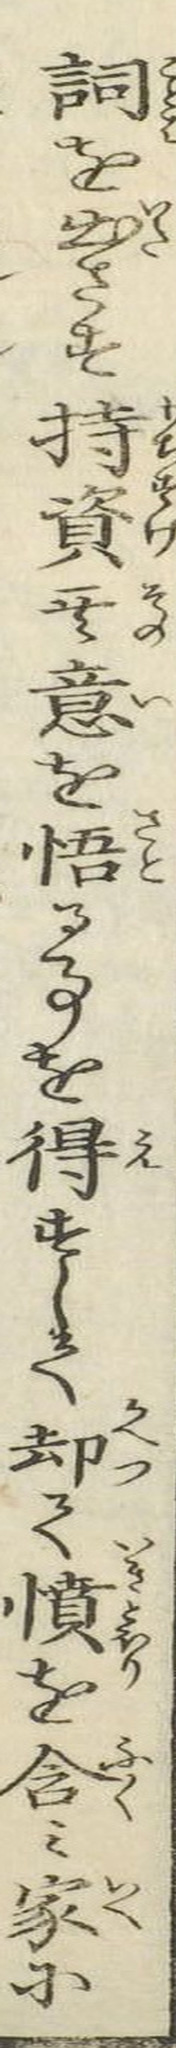詞を出さす持資其意を悟る事を得すして却て憤を含み家に
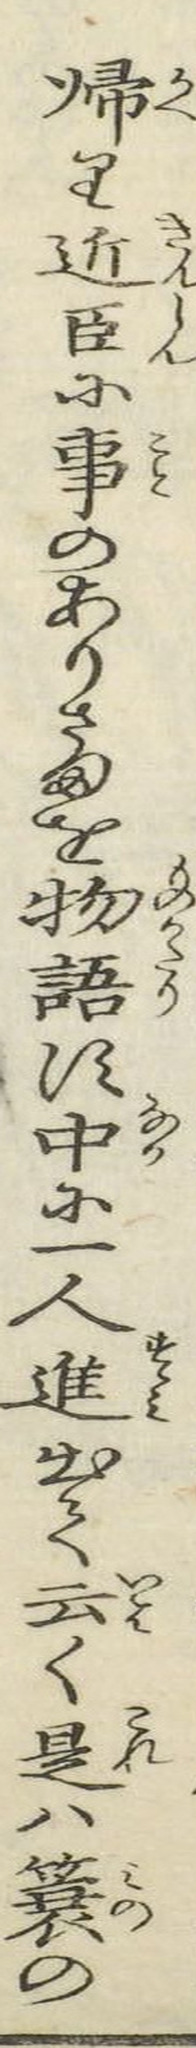帰り近臣に事のありさまを物語す中に一人進出て云く是は簑の
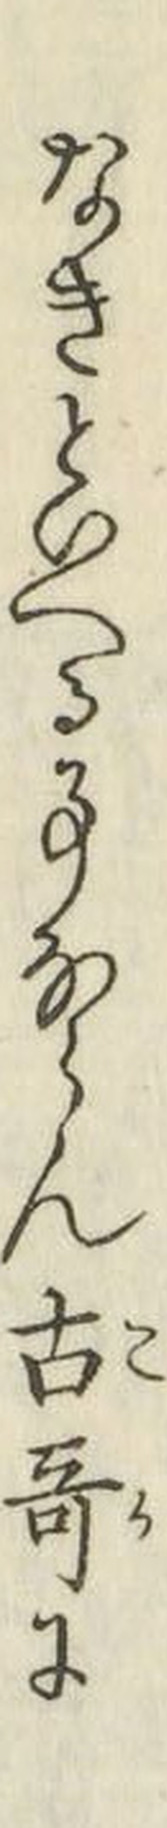なきといへる事ならん古哥に
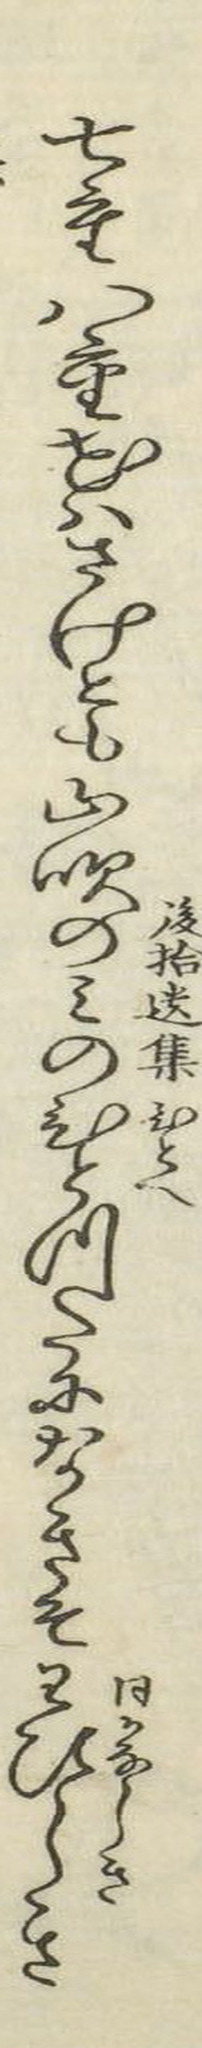七重八重花はさけとも山吹のみのひとつたになきそわひしき
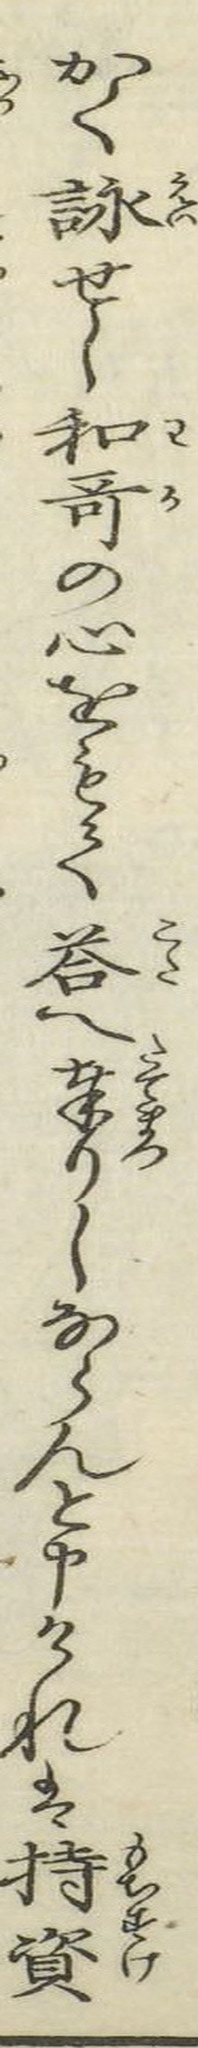かく詠せし和哥の心をもて答へ奉りしならんと申けれは持資
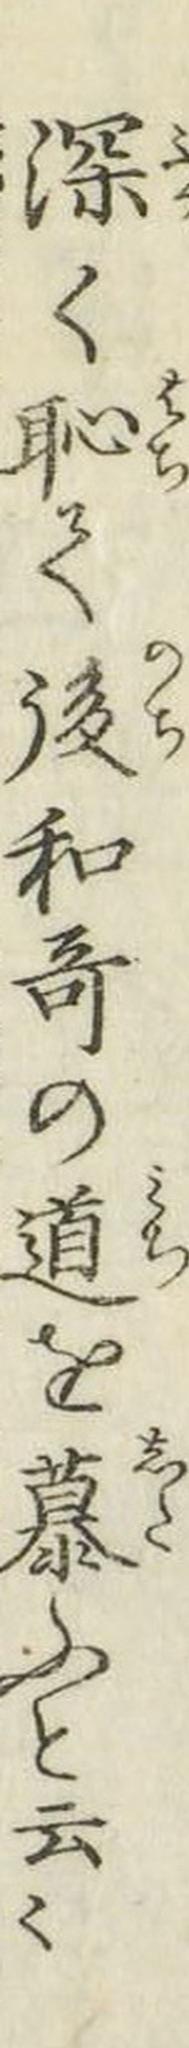深く恥て後和哥の道を慕ふと云々
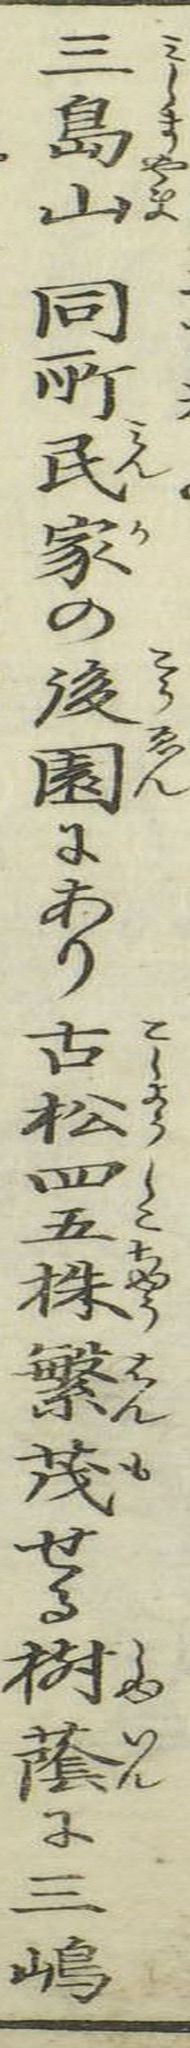三島山同所民家の後園にあり古松四五株繁茂せる樹蔭に三嶋
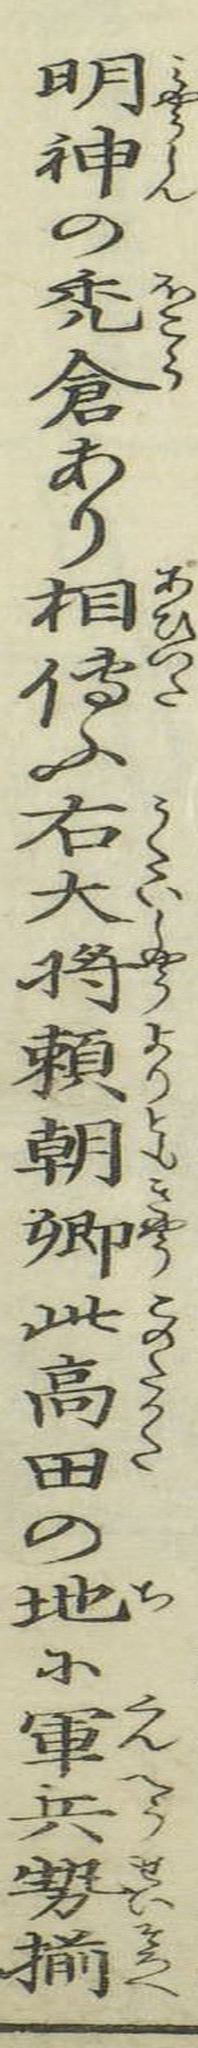明神の禿倉あり相傳ふ右大將頼朝卿此高田の地に軍兵㔟揃

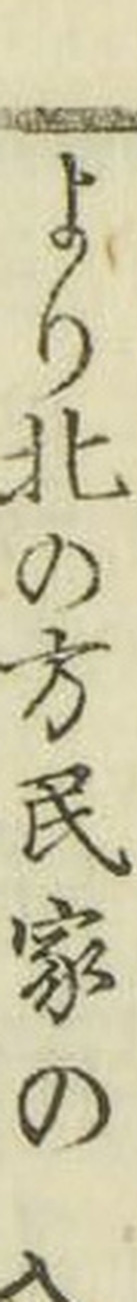より北の方民家の
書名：江戸名所図会 20巻 巻之12
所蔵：東京学芸大学教育コンテンツアーカイブ
